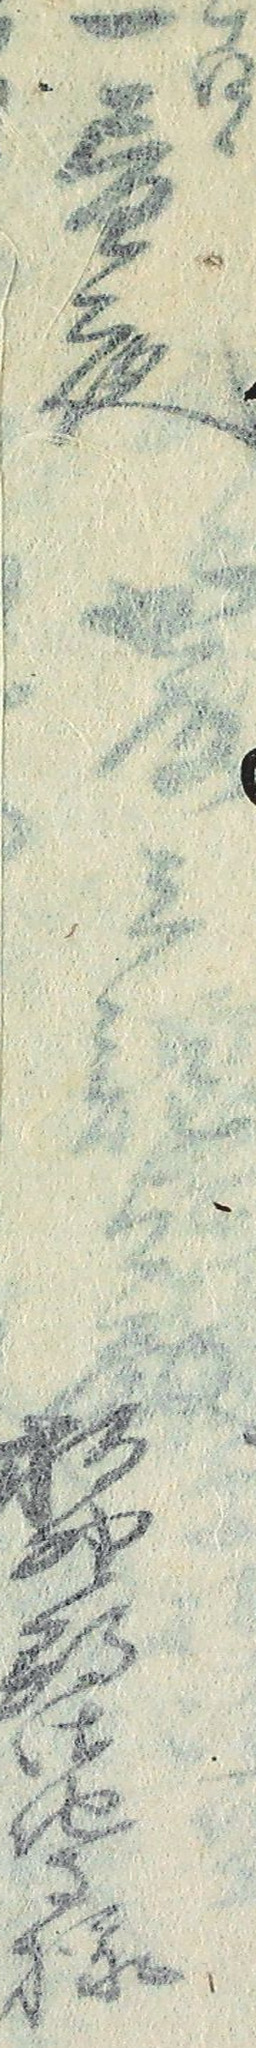一昼夜美馬郡御地方様
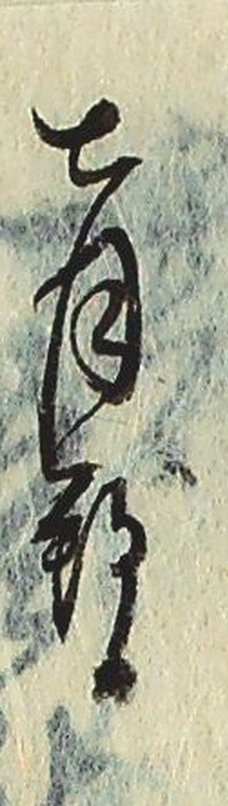七月朔日
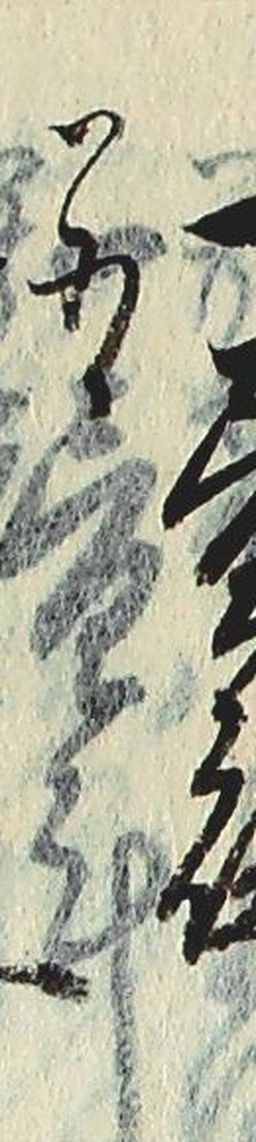同五日

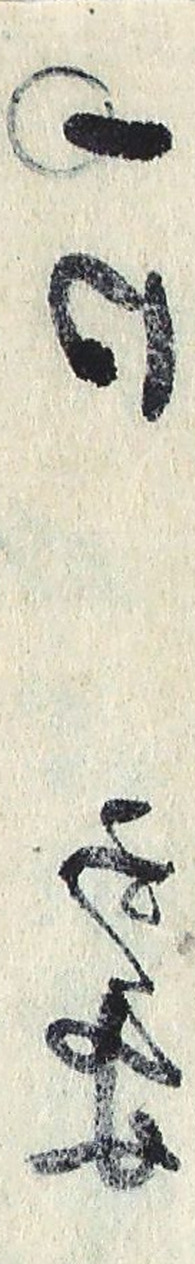同廿一日
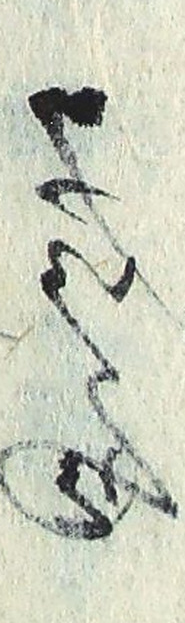同十一日
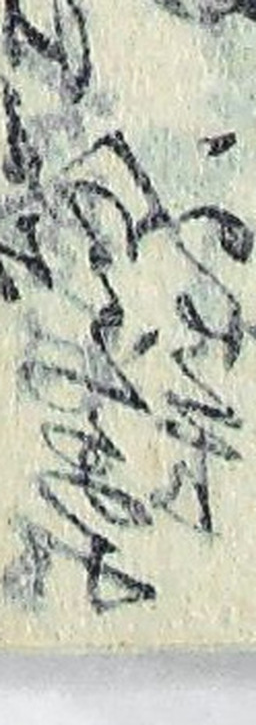同十一日
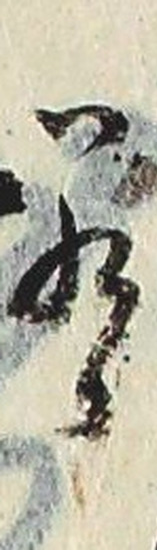同九日
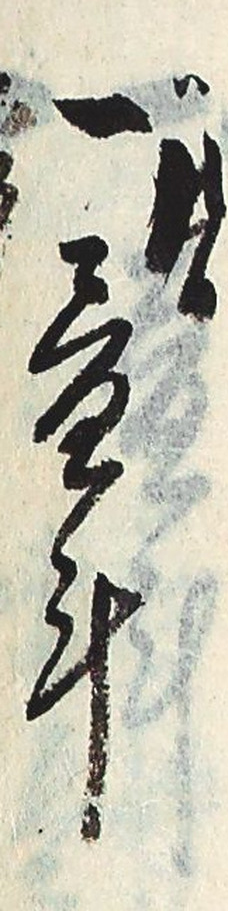一昼夜
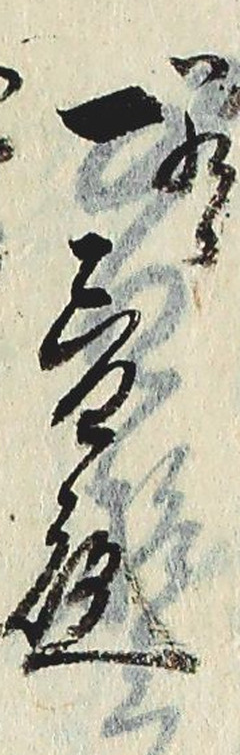一昼夜
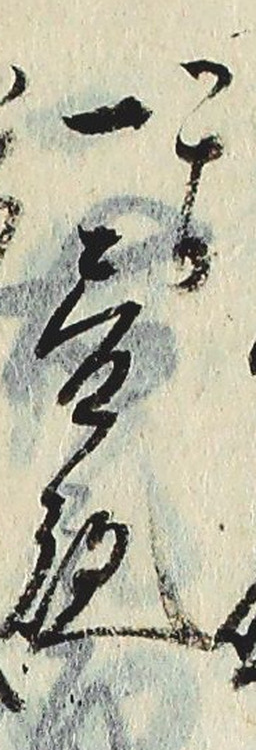一昼夜
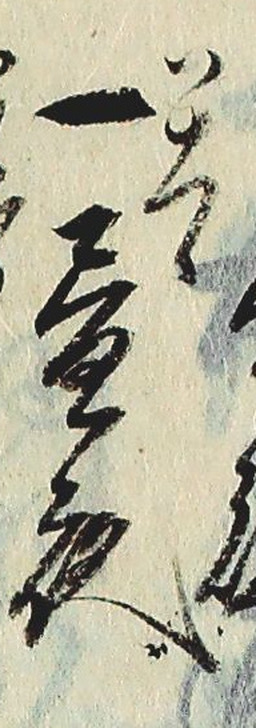一昼夜
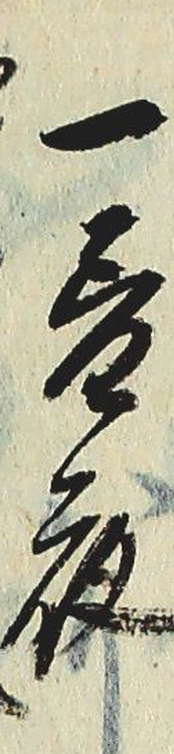一昼夜
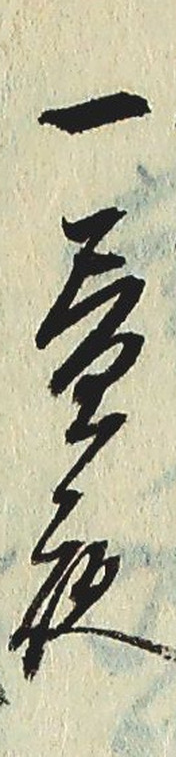一昼夜
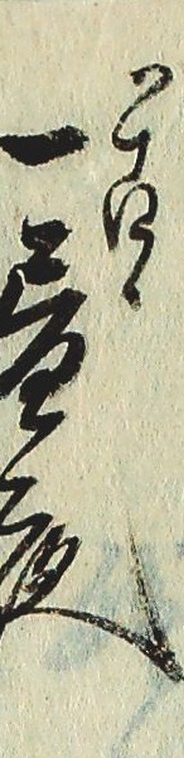一昼夜
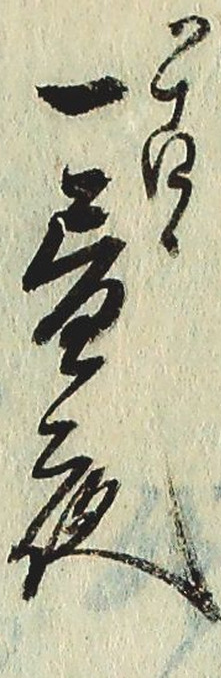一昼夜
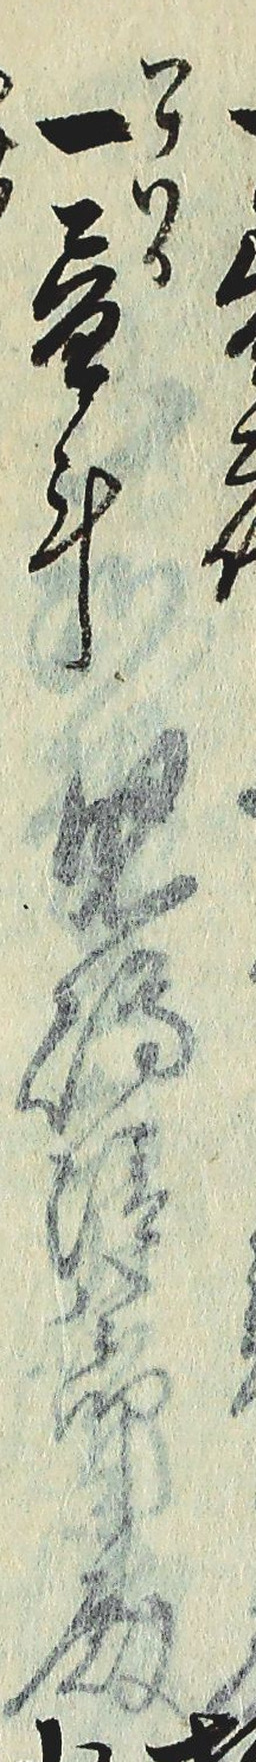一昼夜
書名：名東郡中諸割賦元帳
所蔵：鳴門教育大学 Naruto University of Education
